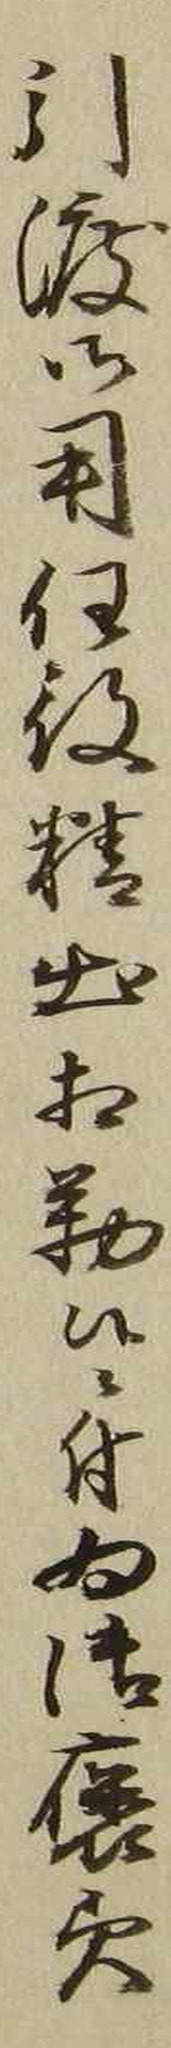引渡御用伺役精出相勤候ニ付ゐ御褒美
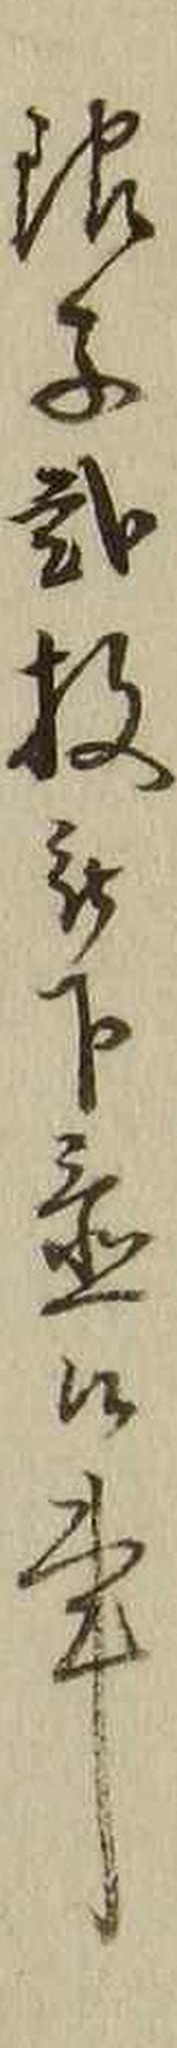銀子弐枚被下置候事
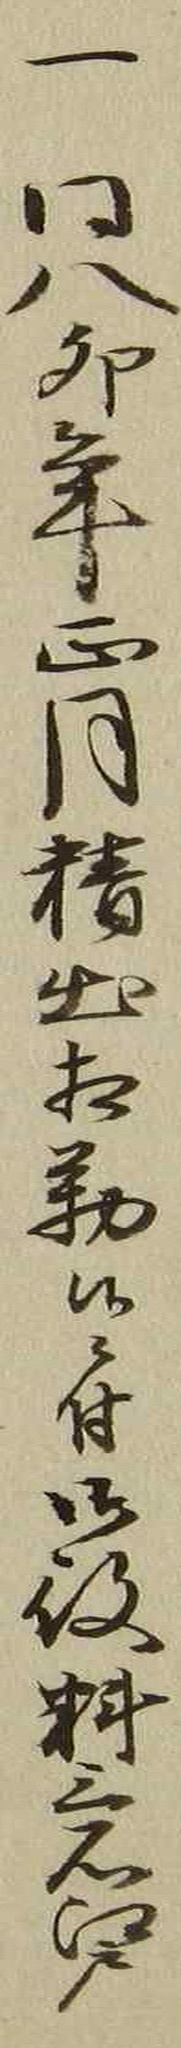一同八夘年正月精出相勤候ニ付御役料三石江戸
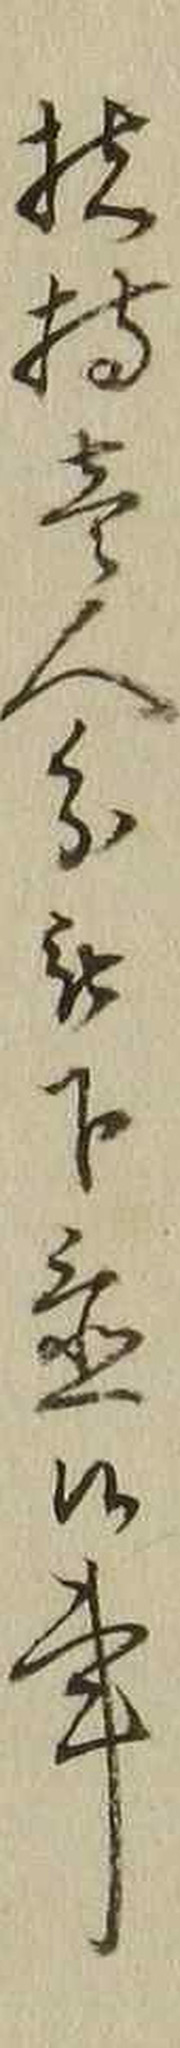扶持壱人分被下置候事
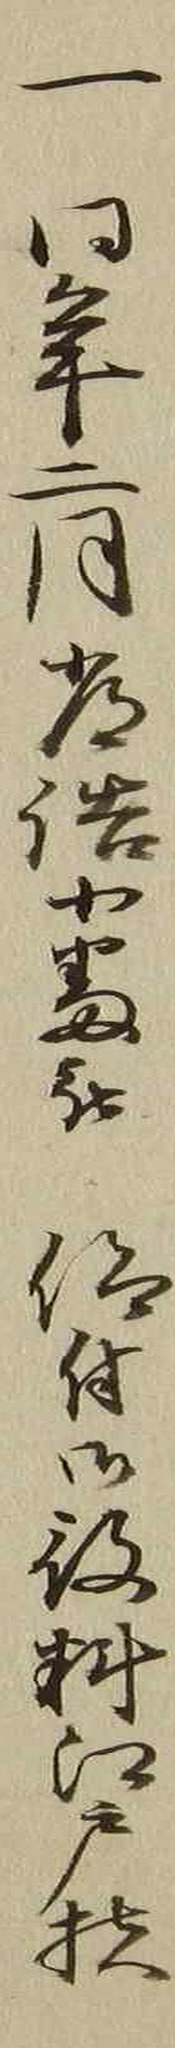一同年二月常詰小番被仰付御役料江戸扶
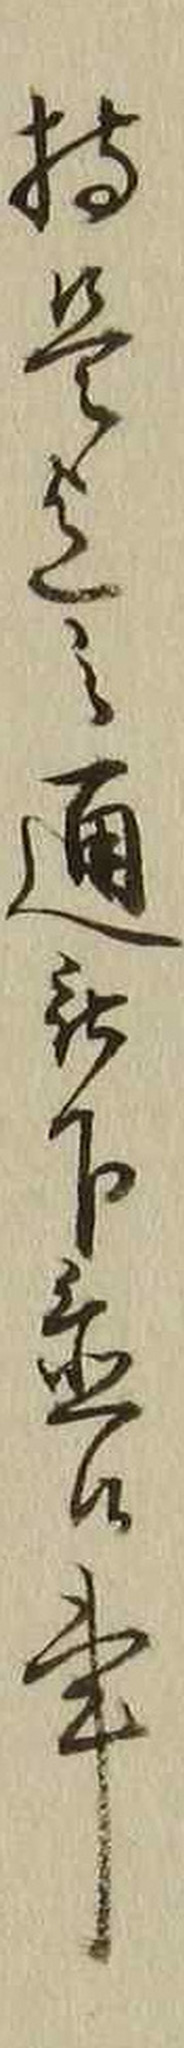持是迄之通被下置候事
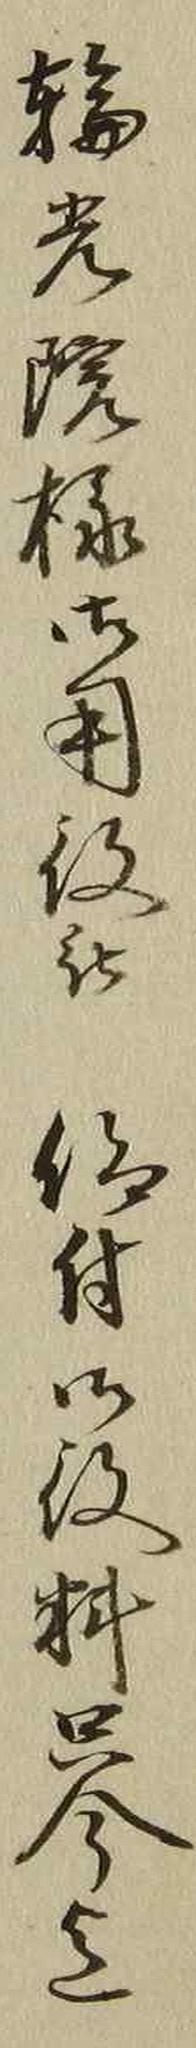輪光院様御用役被仰付御役料只今迄
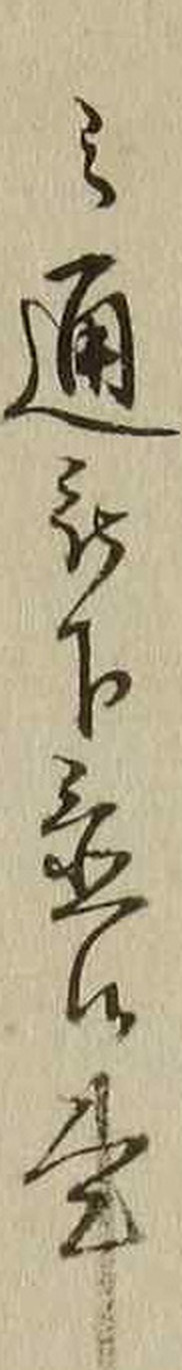之通被下置候事
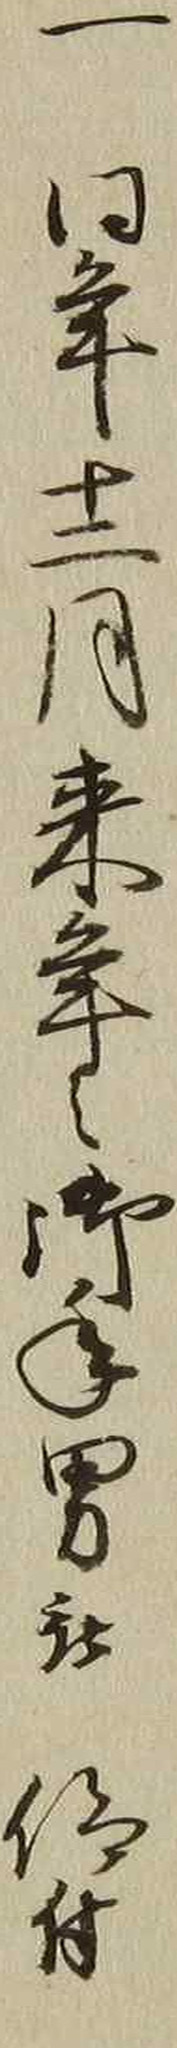一同年十二月来年之御年男被仰付
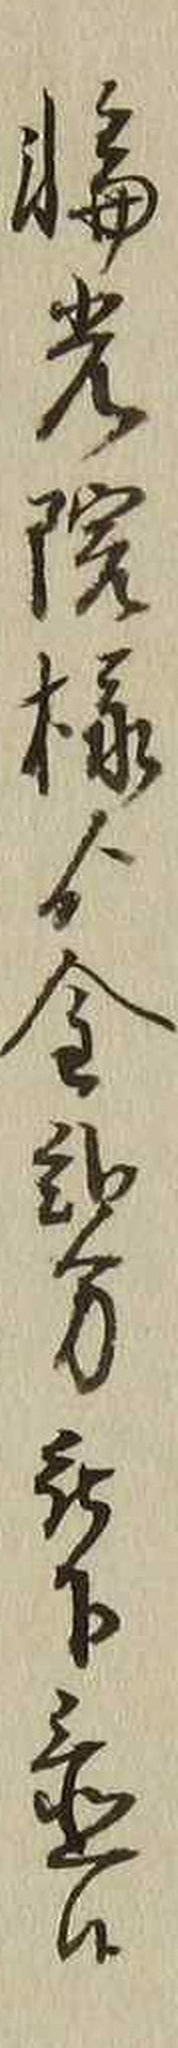輪光院様ゟ金弐方被下置候
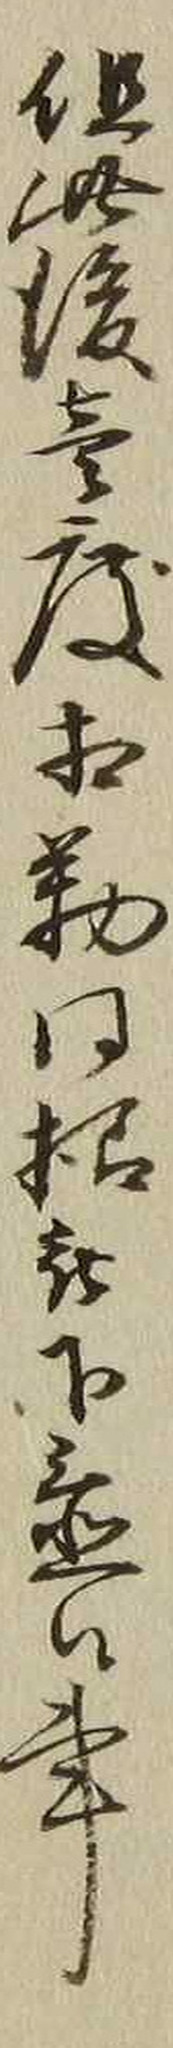但此後壱度相勤同様被下置候事
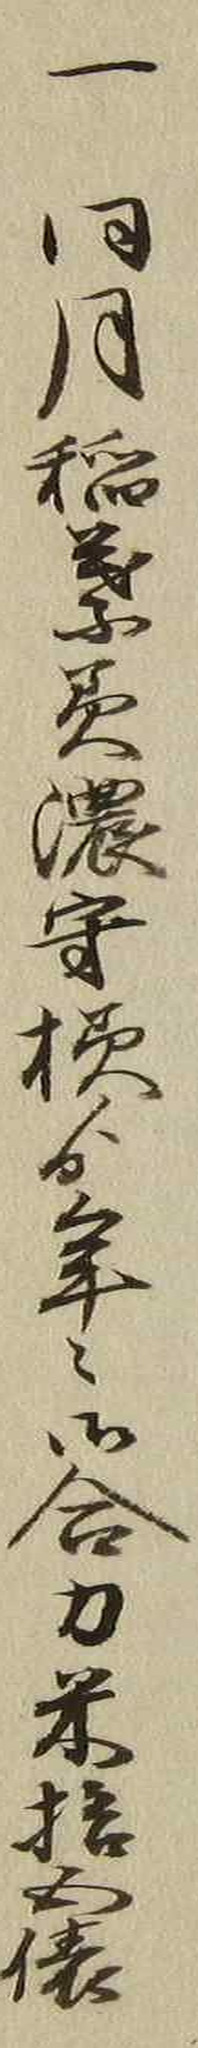一同月稲葉美濃守様ゟ年々御合力米拾五俵
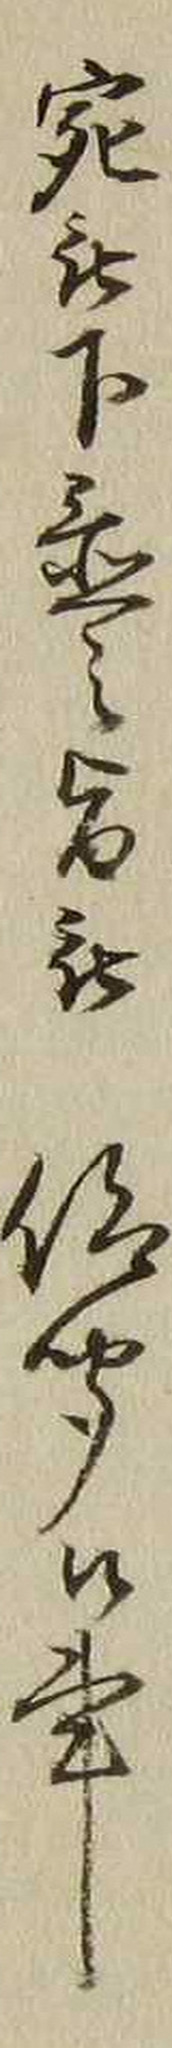宛被下置之旨被仰聞候事
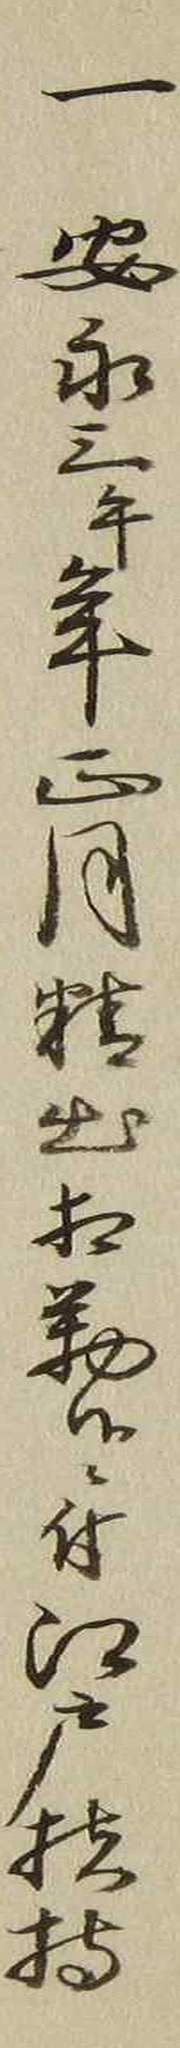一安永三午年正月精出相勤候ニ付江戸扶持
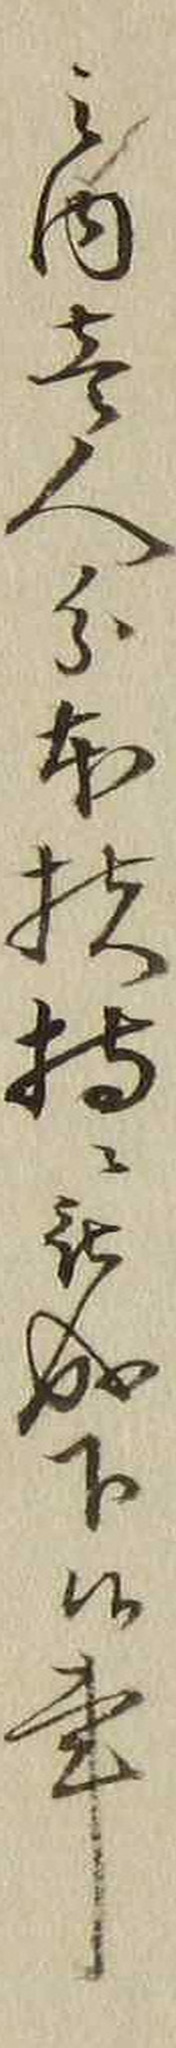之内壱人分本扶持ニ被成下候事
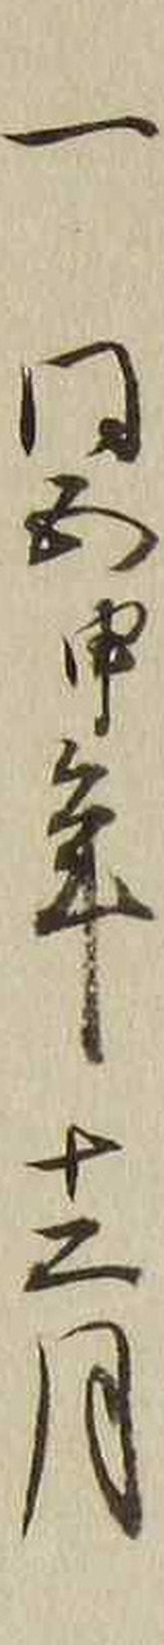一同五申年十二月
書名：諸士系譜　巻之114　か之部22
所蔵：会津若松市立会津図書館
